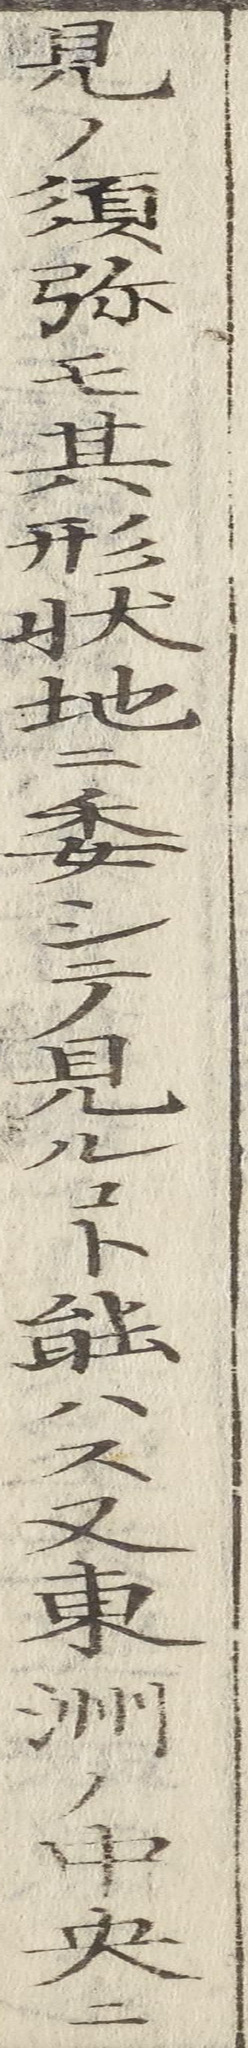見ノ須弥モ其形状ニ委シテ見ルコト能ハス又東洲ノ中央ニ
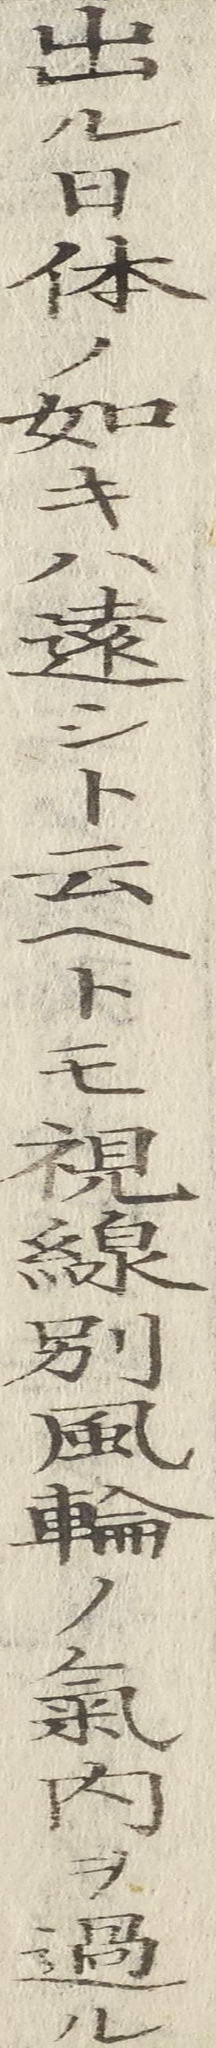出ル日体ノ如キハ遠シト云ヘトモ視線別風輪ノ気内ヲ過ル
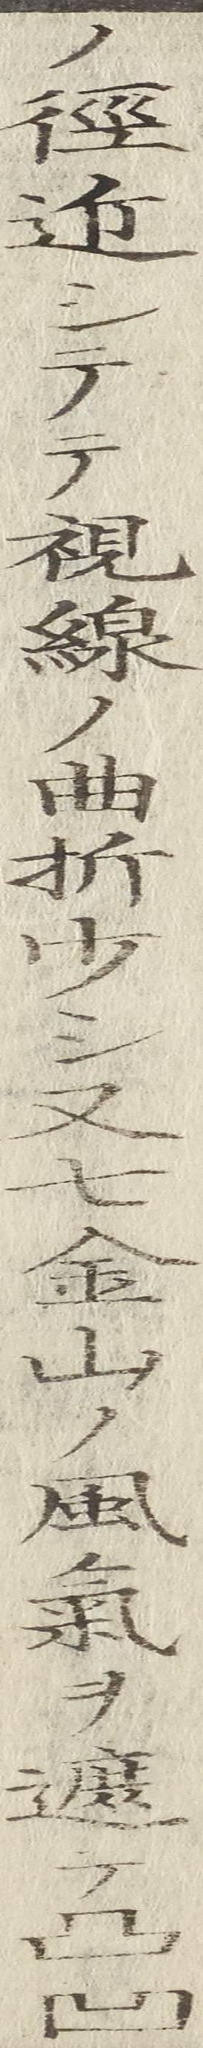ニ径近シテテ視線ノ曲折少シ又七金山ノ風気ヲ遮テ凸凹
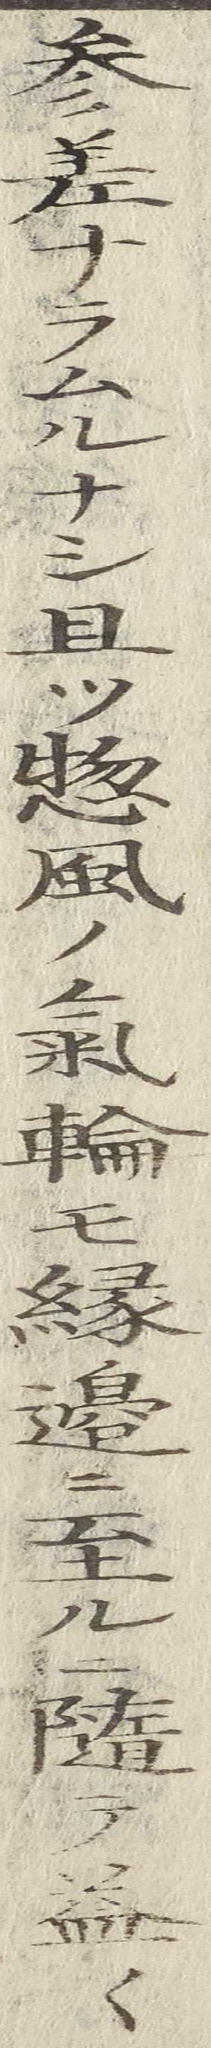参差ナラムルナシ且ツ惣風ノ気輪モ縁辺ニ至ルニ随テ益〱

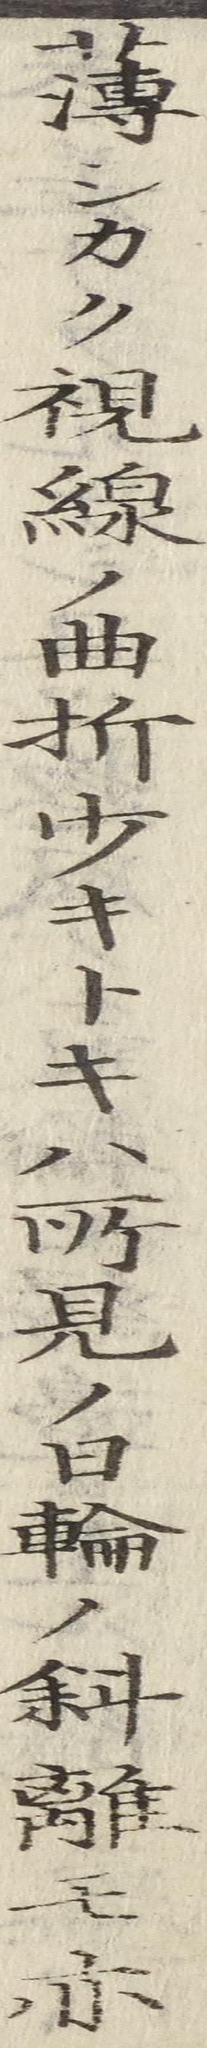薄シカク視線ノ曲折少キトキハ所見ノ日輪ノ斜離モ亦
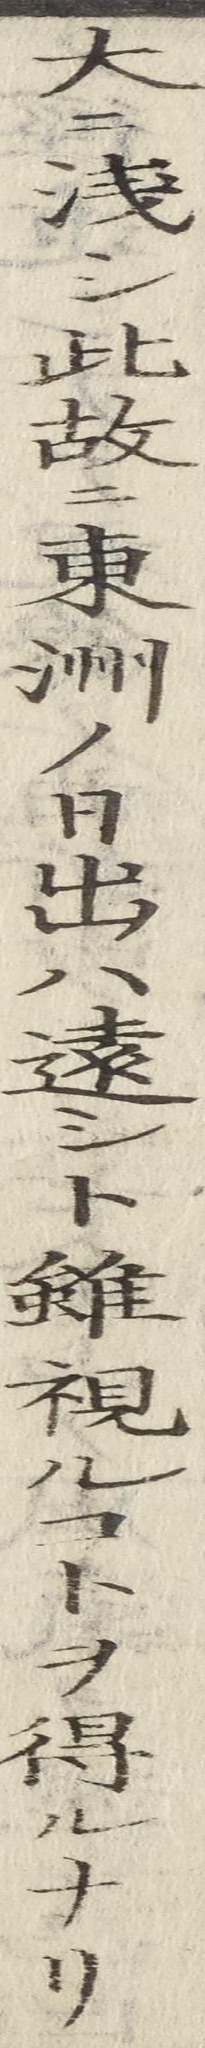大ニ浅シ此故ニ東洲ノ日出ハ遠シト雖視ルコトヲ得ルナリ
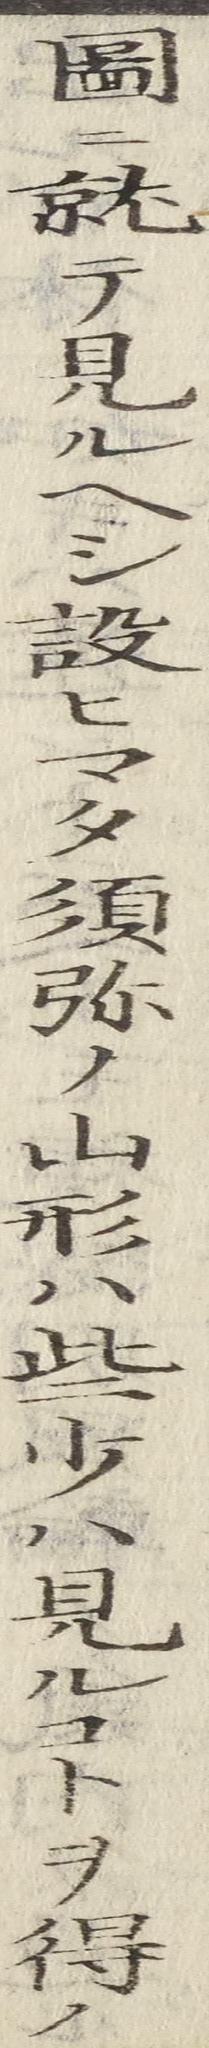図ニ就テ見ルヘシ設ヒマタ須弥ノ山形ハ些少ハ見ルコトヲ得ム
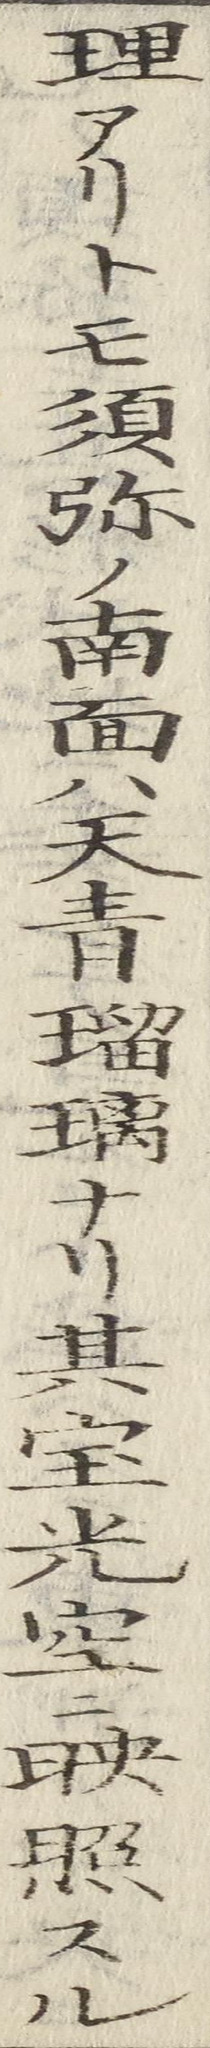理アリトモ須弥ノ南面ハ天青瑠璃ナリ其宝光空ニ映照スル
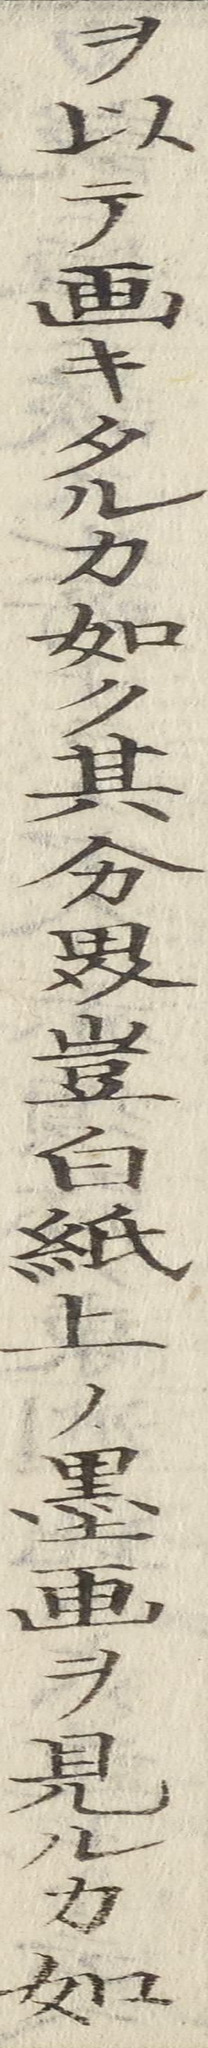ヲ以テ画キタルカ如ク其分界豈白紙上ノ墨画ヲ見ルカ如
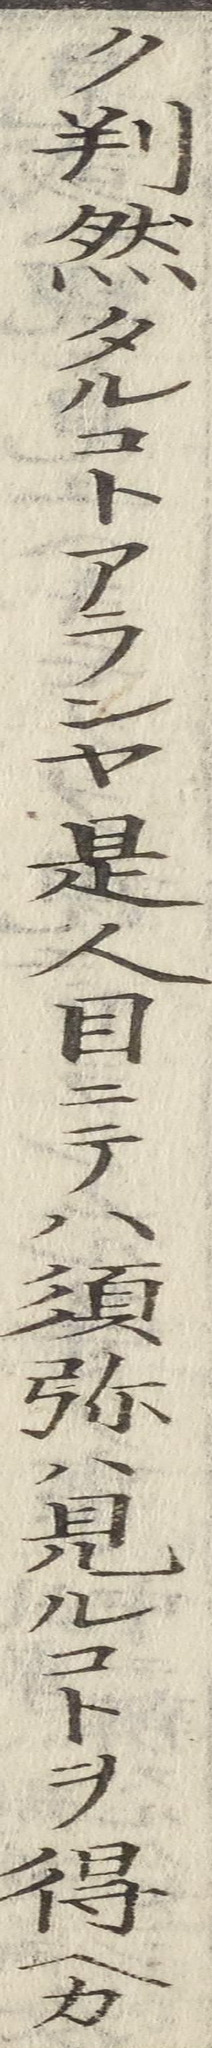ク判然タルコトアランヤ是人目ニテハ須弥ハ見ルコトヲ得ヘカ
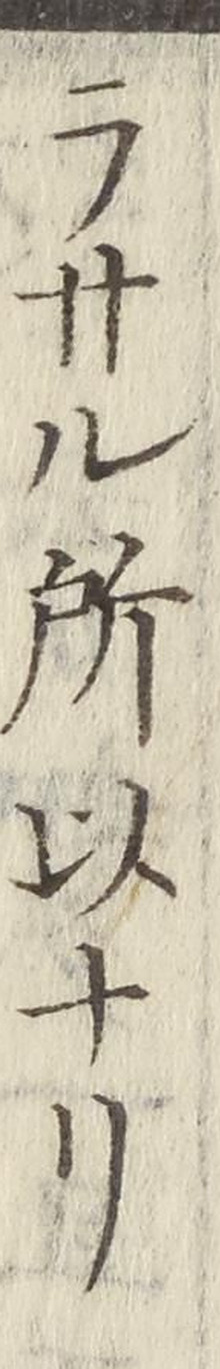ラサル所以ナリ
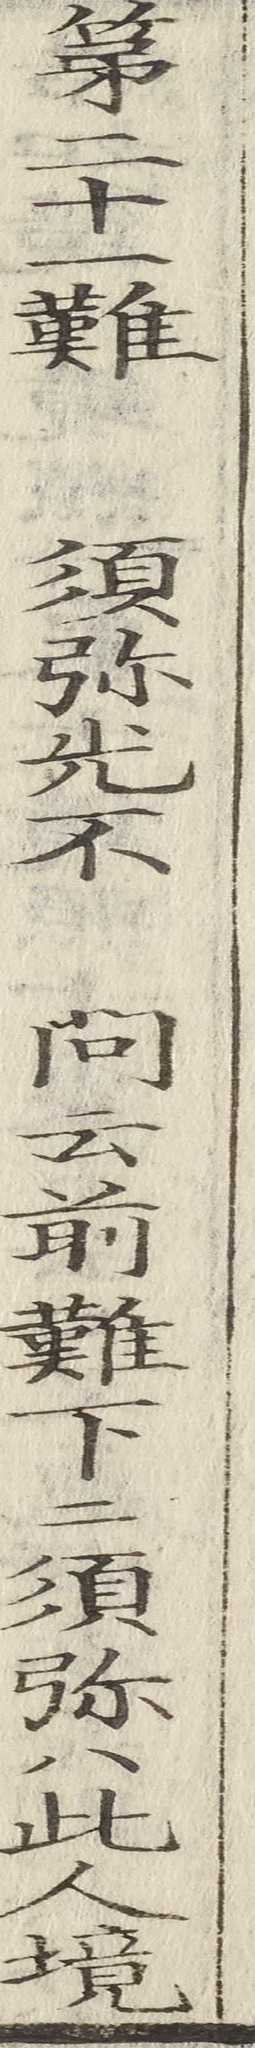第二十一難須弥光不問云前難下ニ須弥ハ此人境
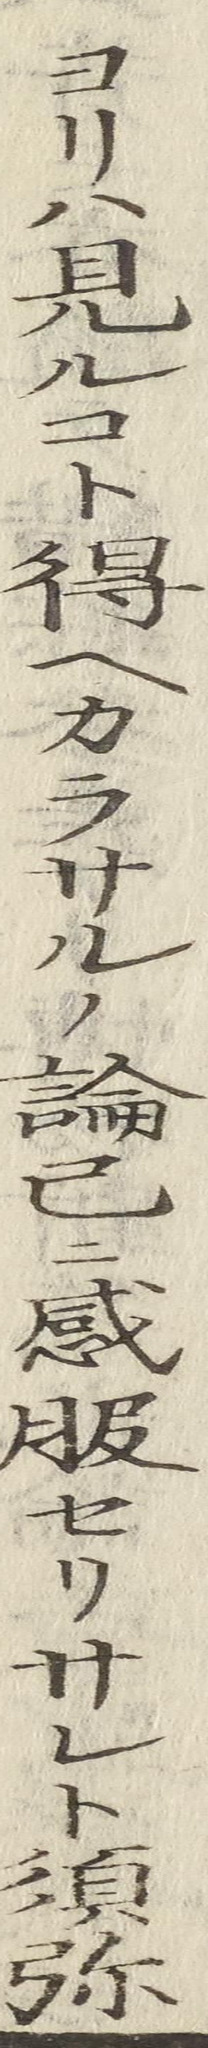ヨリハ見ルコト得ヘカラサルノ論已ニ感服セリサレト須弥
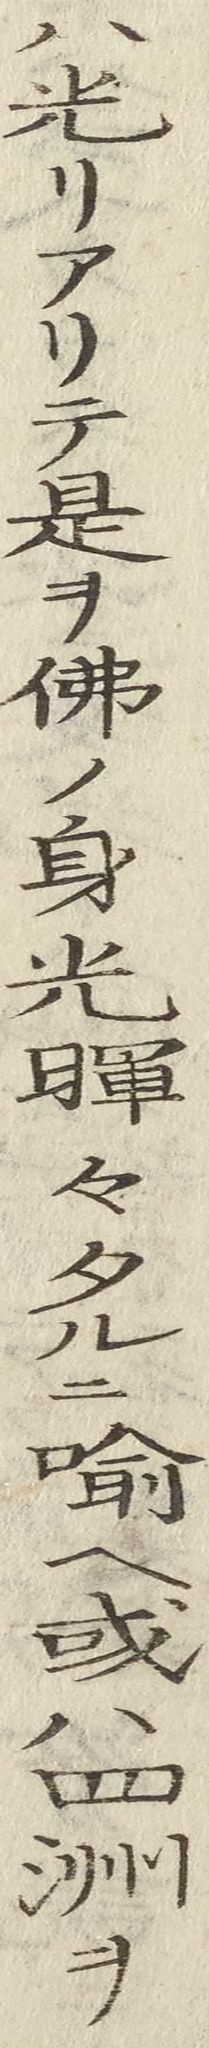ハ光リアリテ是ヲ仏ノ身光暉々タルニ喩ヘ或ハ四洲ヲ
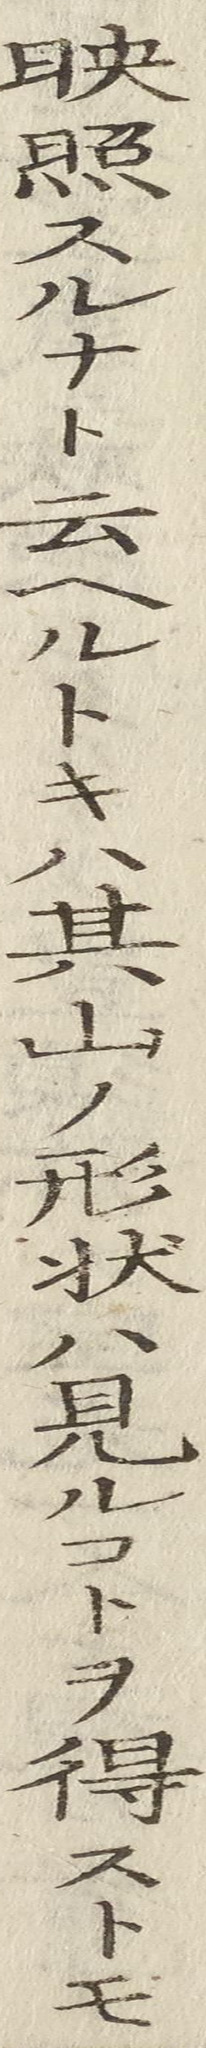映照スルナト云ヘルトキハ其山ノ形状ハ見ルコトヲ得ストモ
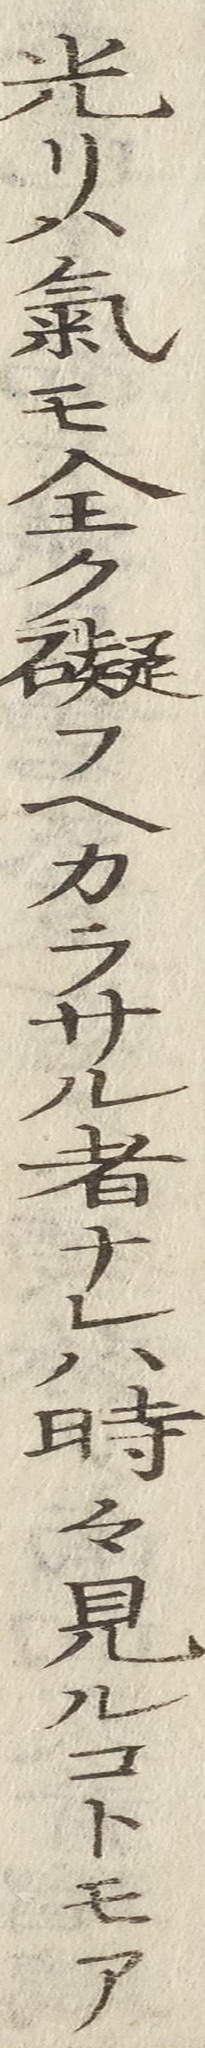光リハ気モ全ク礙フヘカラサル者ナレハ時々見ルコトモア
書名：護法新論　二編　中
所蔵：東京大学地震研究所図書室 Earthquake Research Institute Library, The University of Tokyo, JAPAN
